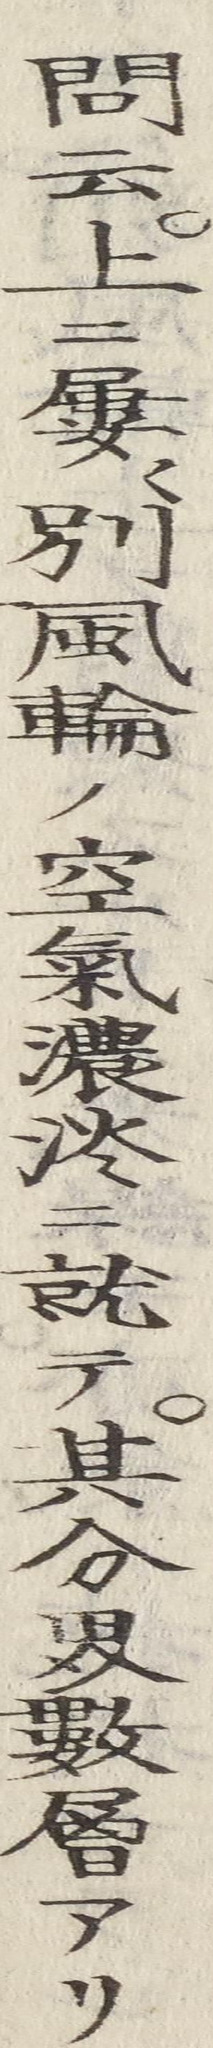問云。上ニ屢〱別風輪ノ空気濃淡ニ就テ。其分界数層アリ
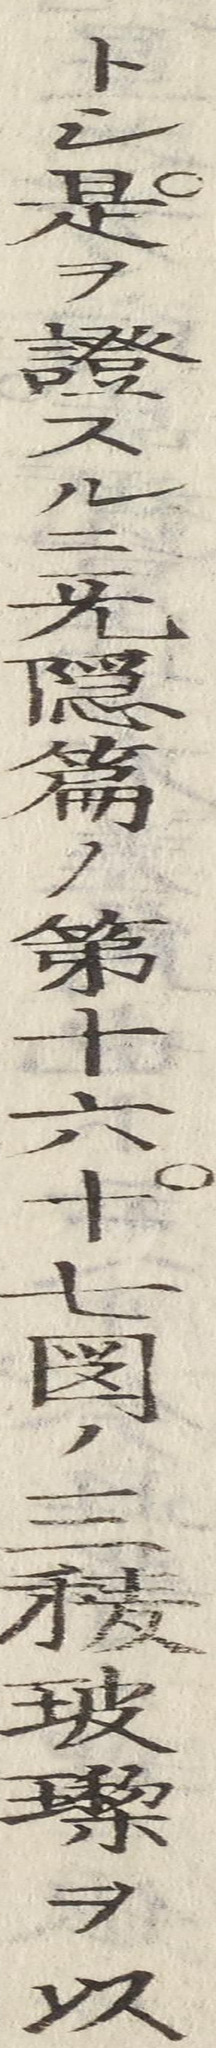トシ。是ヲ証スルニ尤隠篇ノ第十六。十七図ノ三稜玻瓈ヲ以
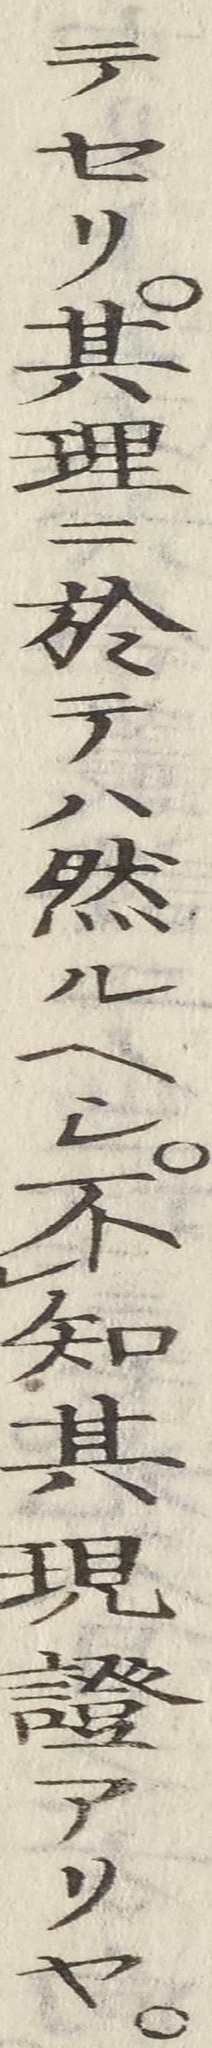テセリ。其理ニ於テハ然ルヘシ。不知其現証アリヤ。
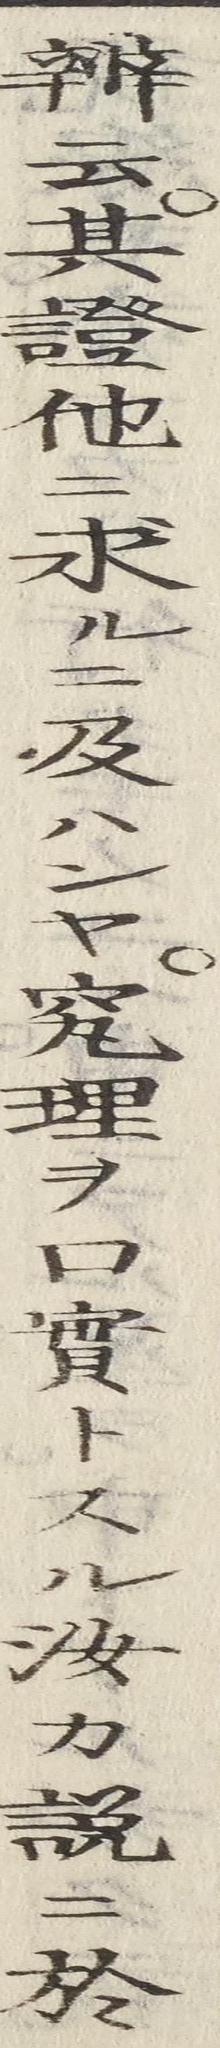弁云。其証他ニ求ルニ及ハンヤ。究理ヲ口実トスル汝カ説ニ於
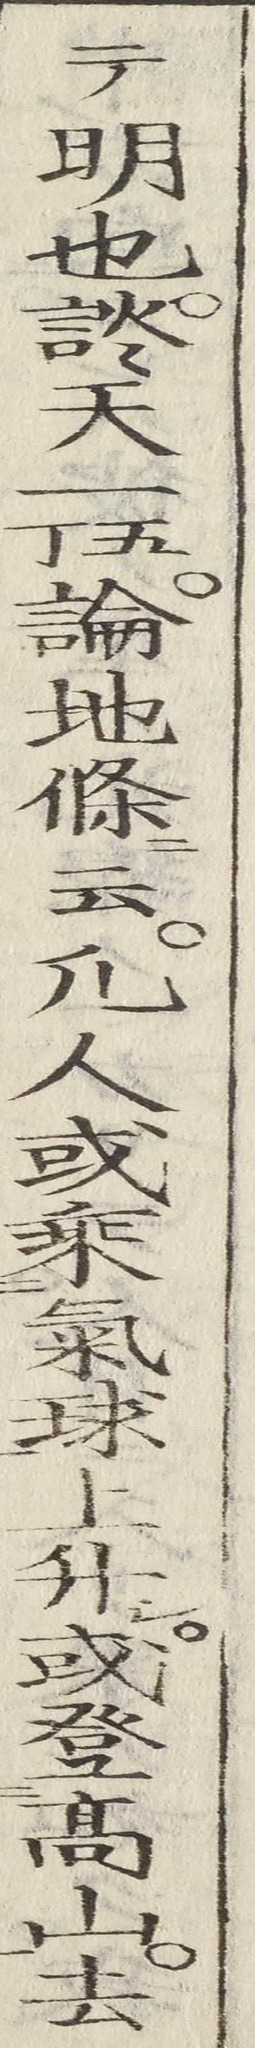テ明也。談天一五丁。論地条云。凡人或乗ニ気球上升。或登ニ高山。去
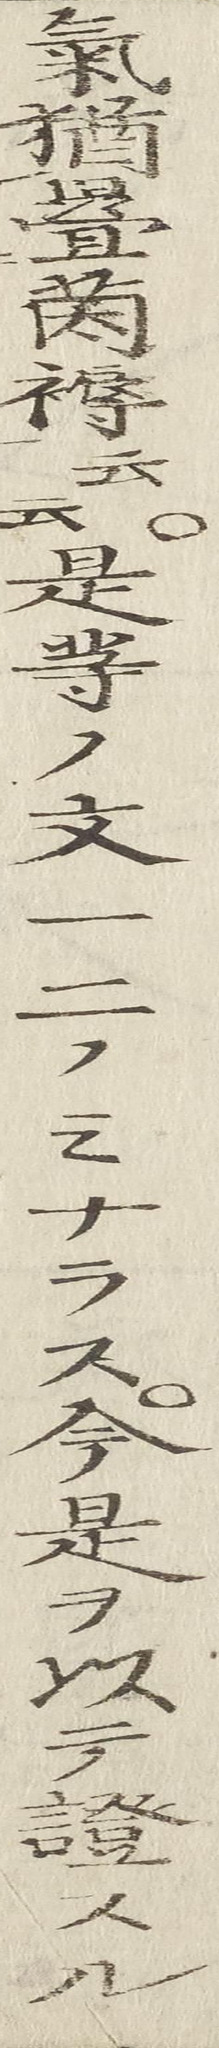気猶畳ニ茵褥云云。是等ノ文一二ノミナラス。今是ヲ以テ証スル
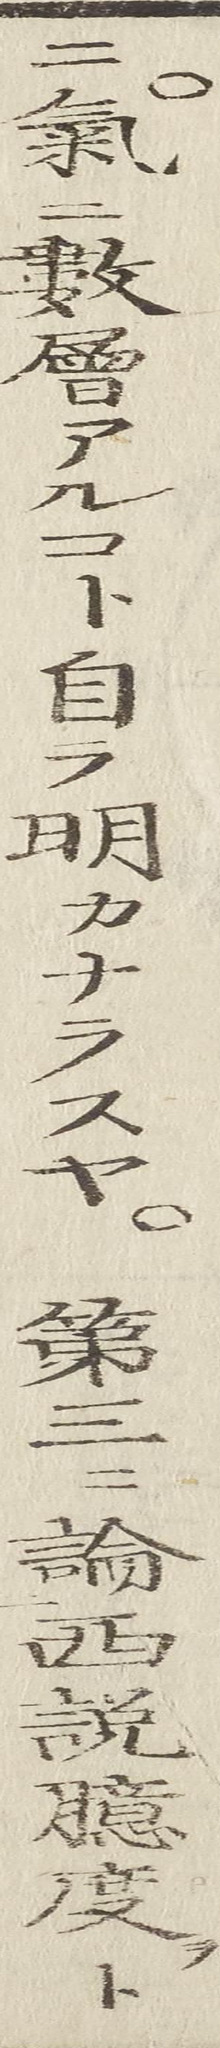ニ。気ニ数層アルコト自ラ明カナラスヤ。第三ニ論西説臆度
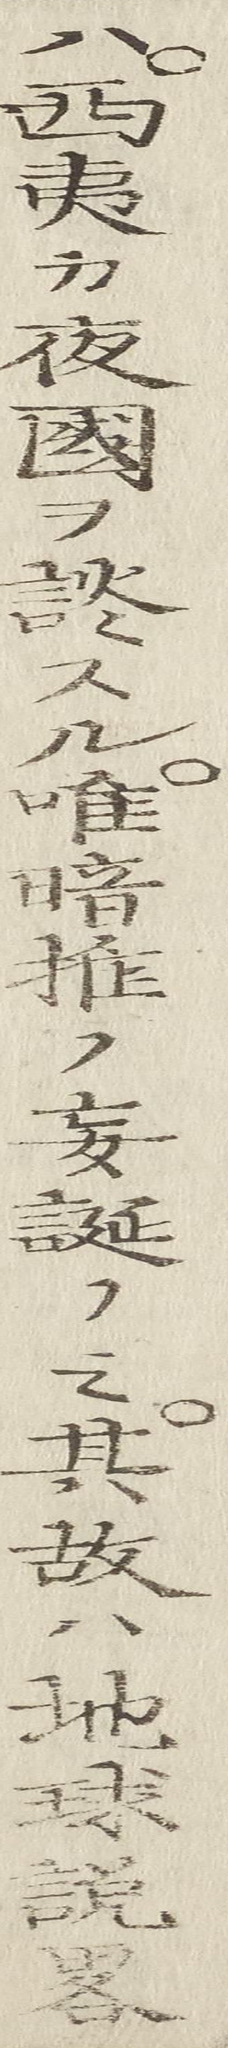ハ。西夷カ夜国ヲ談スル。唯暗推ノ妄誕ノミ。其故ハ地球説略
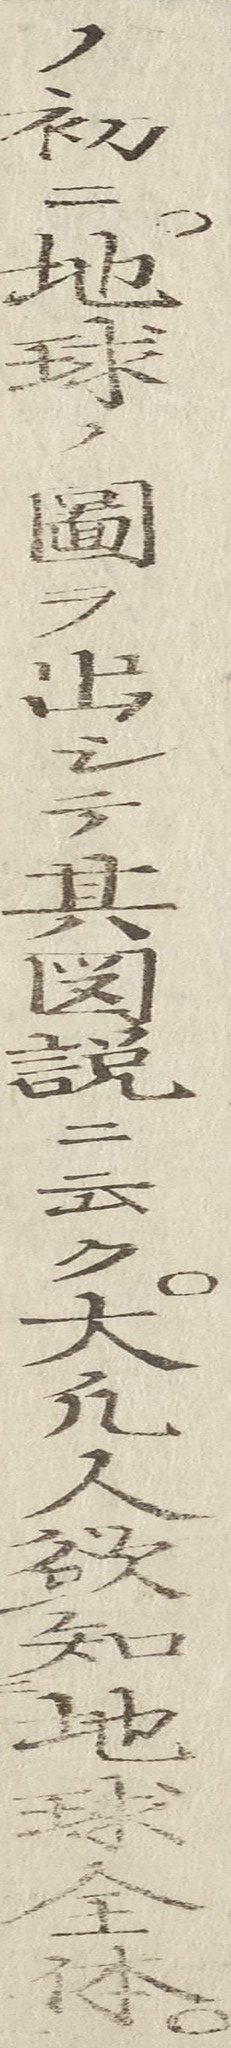ノ初ニ。地球ノ図ヲ出シテ其図説ニ云ク。大凡人欲知ニ地球全体。

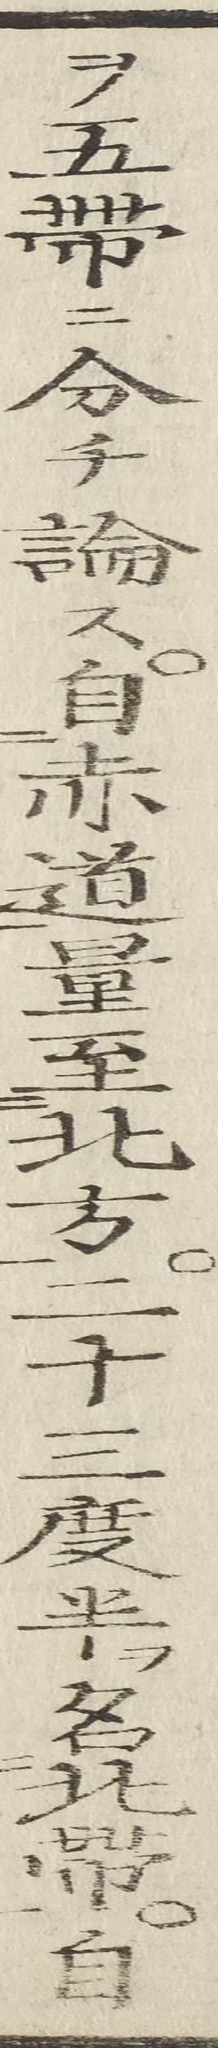ヲ五帯ニ分チ論ス。自ニ赤道量至ニ北方。二十三度半名ニ北帯。自ニ
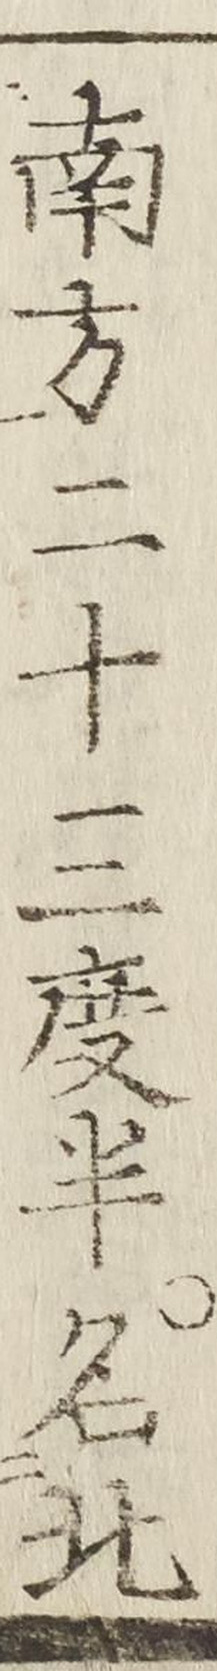南方二十三度半。名ニ北
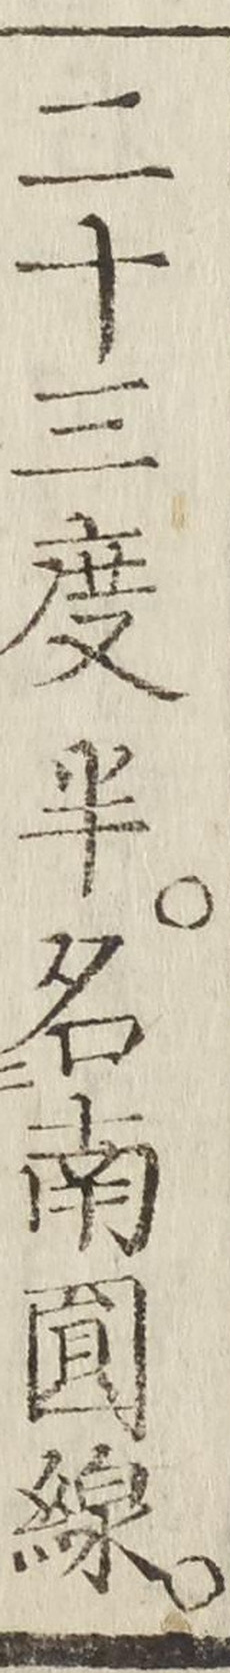二十三度半。名ニ南円線。
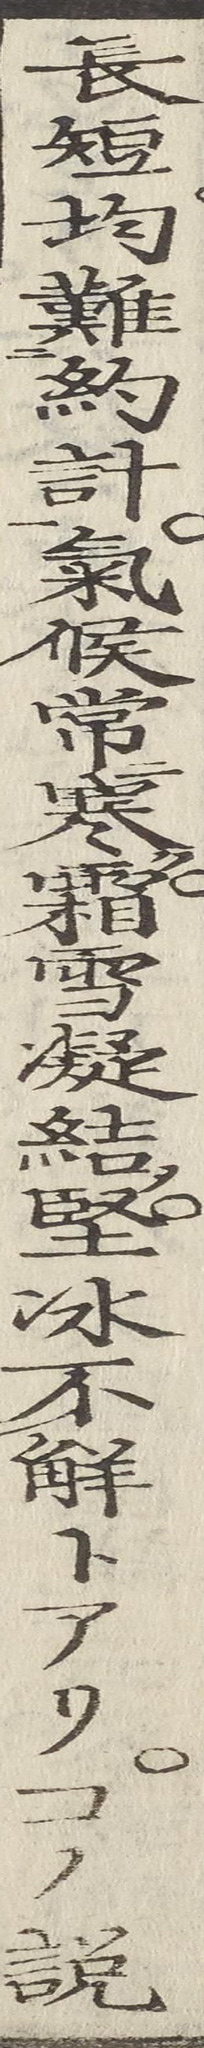長短。均難ニ約計。気候常寒。霜雪凝結。堅冰不觧トアリ。コノ説
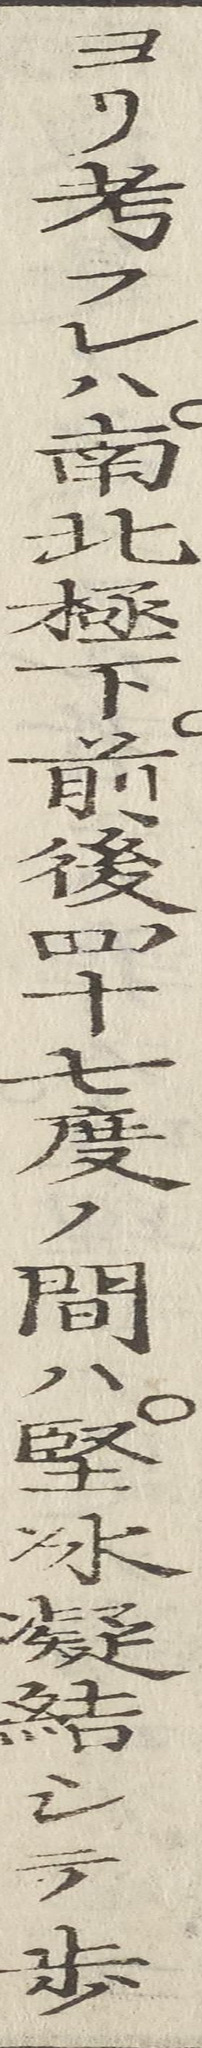ヨリ考フレハ。南北極下。前後四十七度ノ間ハ。堅冰凝結シテ歩
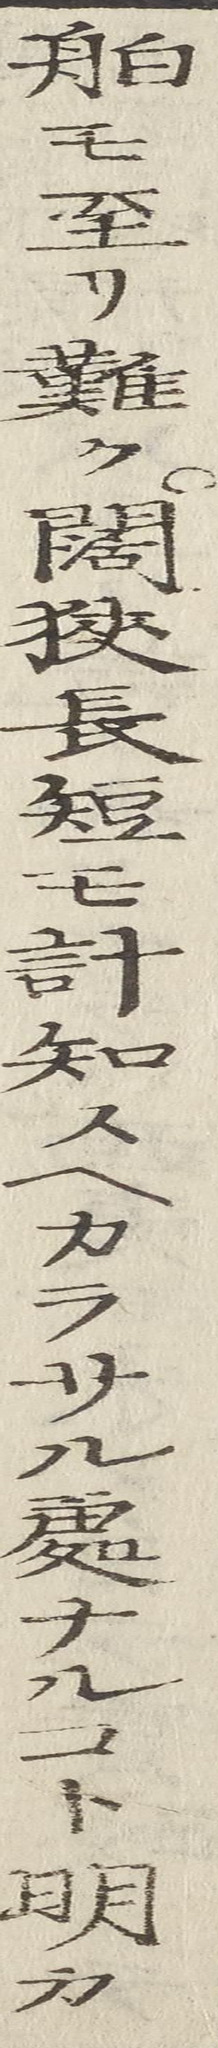舶モ至リ難ク。闊狭長短モ計知スヘカラサル処ナルコト明カ
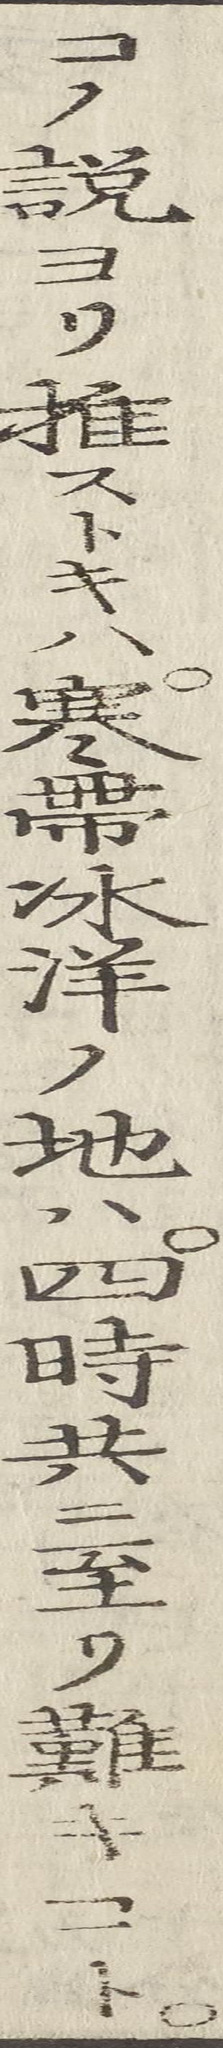コノ説ヨリ推ストキハ。寒帯冰洋ノ地ハ。四時共ニ至リ難キコト。
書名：護法新論　二編　上
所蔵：東京大学地震研究所図書室 Earthquake Research Institute Library, The University of Tokyo, JAPAN
